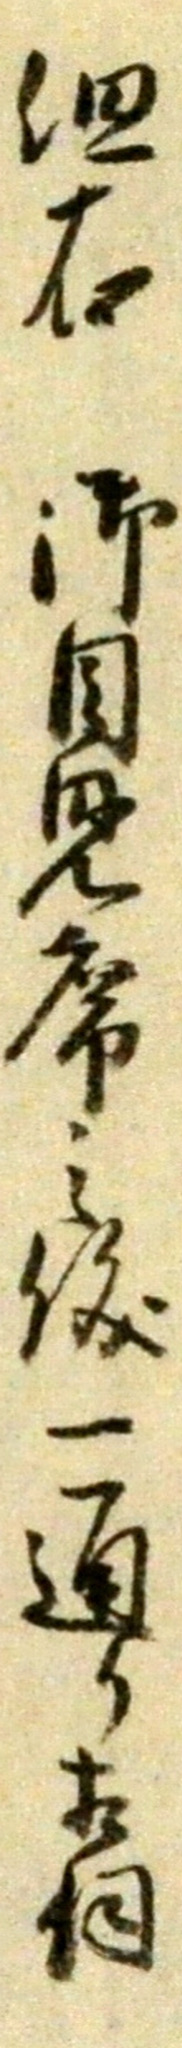但右御目見席之儀一通り相伺
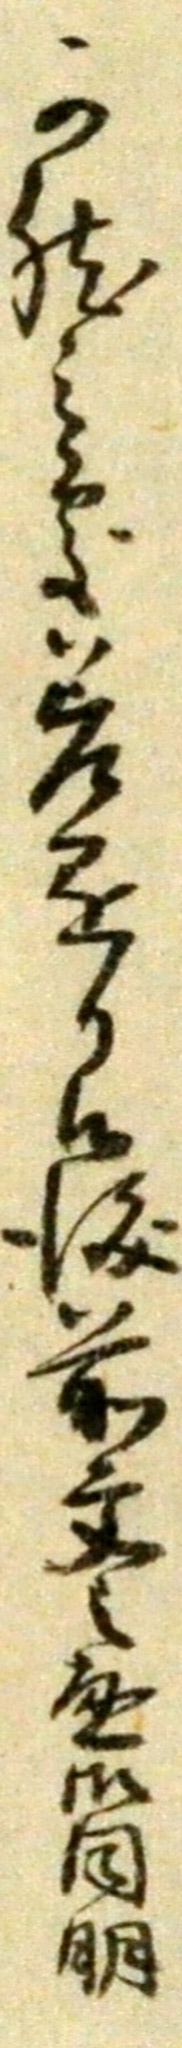可然之處差懸り候儀前文之通御同朋
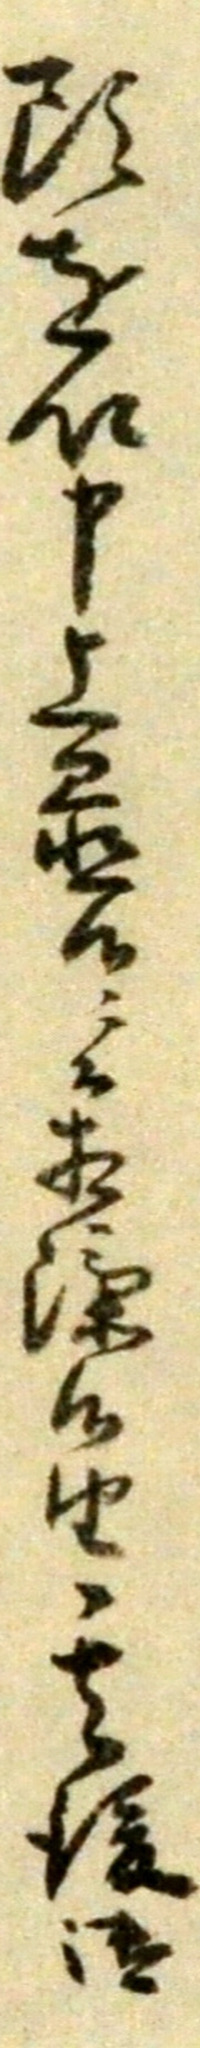頭を御申上置候ニ而相済候由其後御
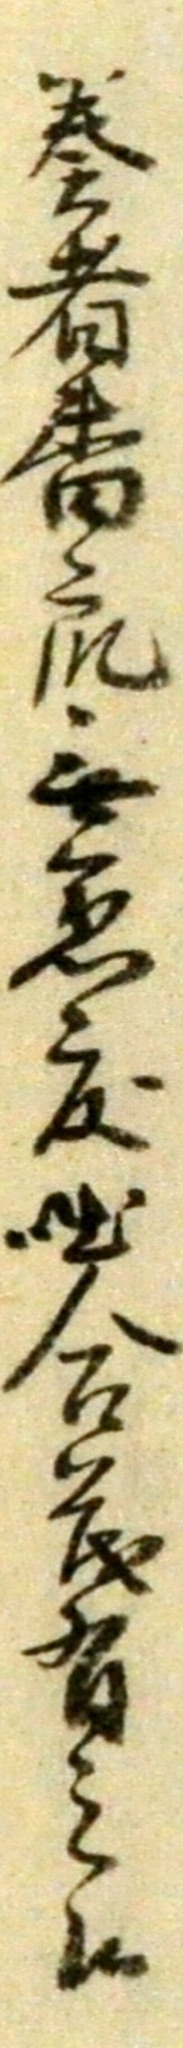奏者番衆無急度咄合も有之候
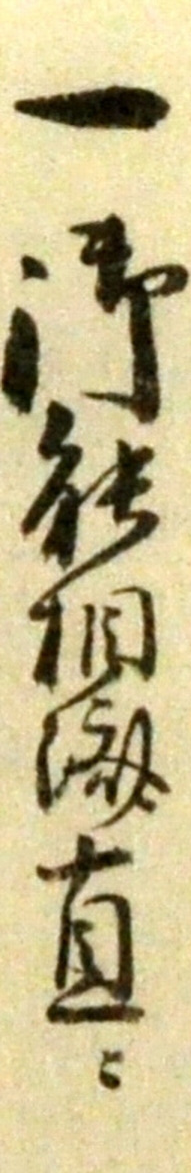一御能相済直ニ

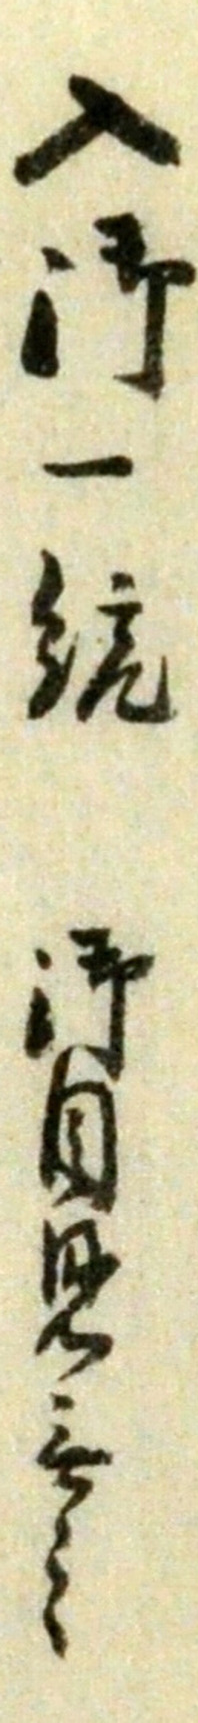入御一統御目見無之
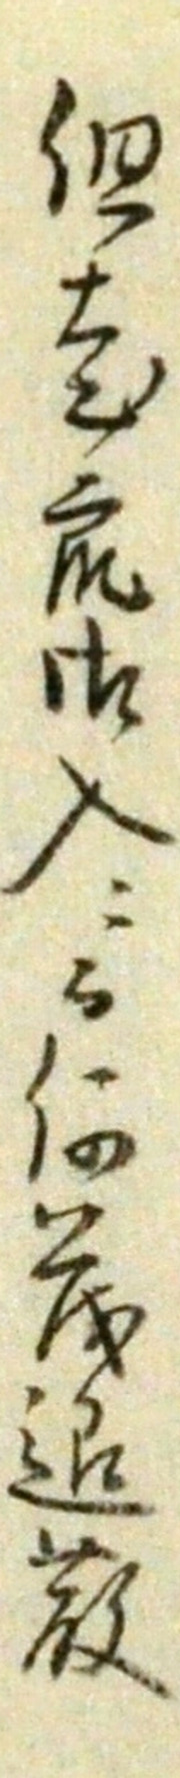但老衆御入ニ而何も退散
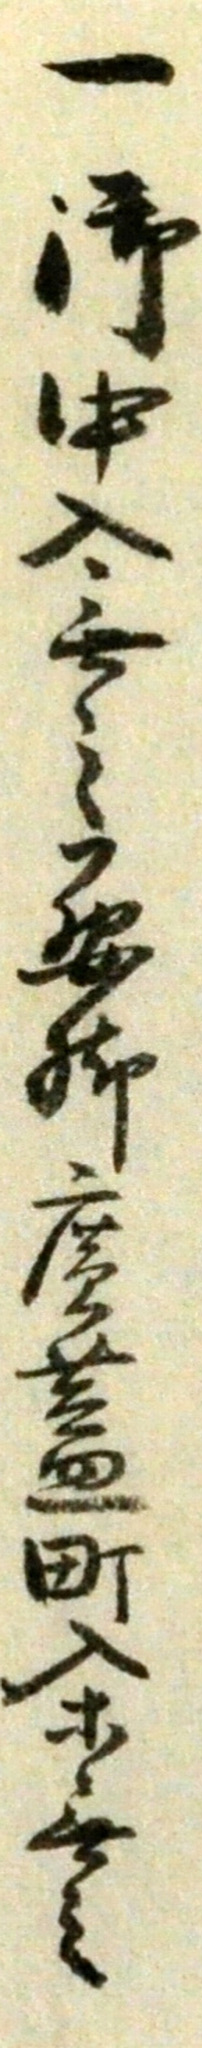一御申入無之要脚廣蓋町入等無之
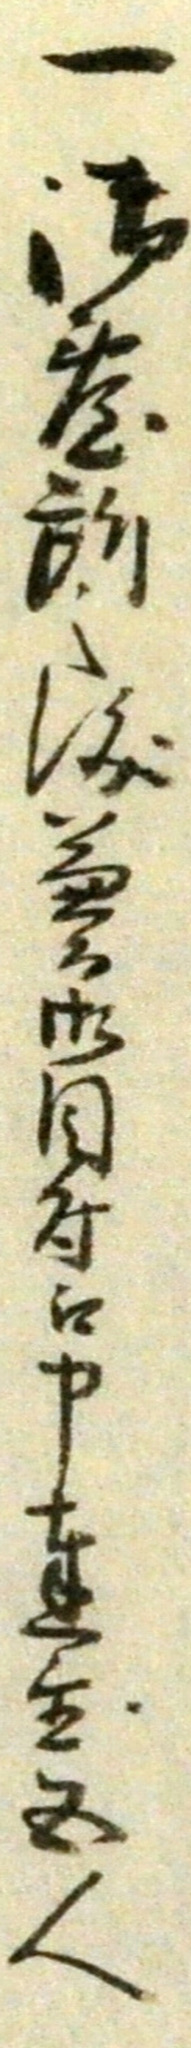一御臺所之儀兼而御目付え申達置五人
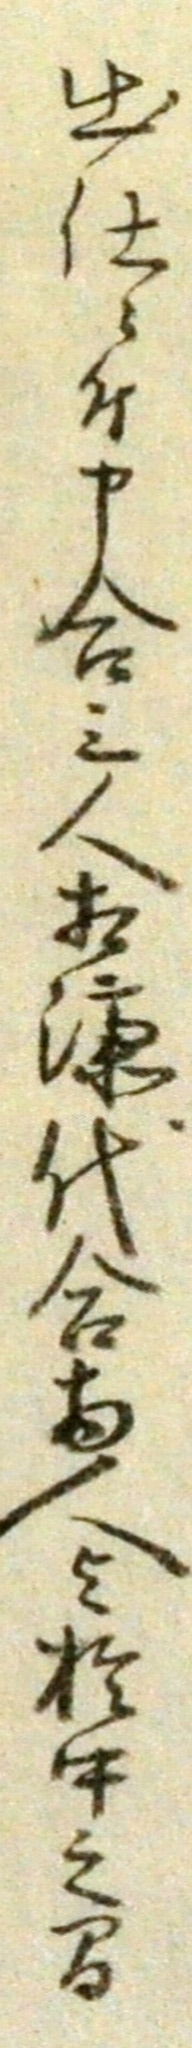出仕ニ付申合三人相済代合両人と於中之間
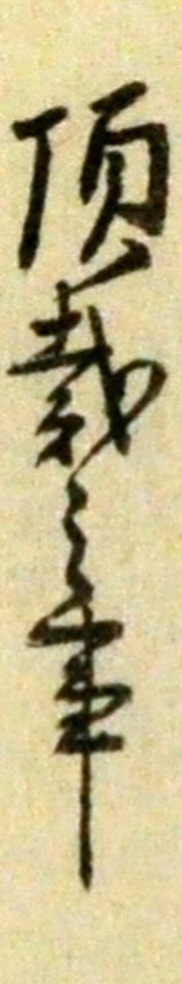頂戴之事
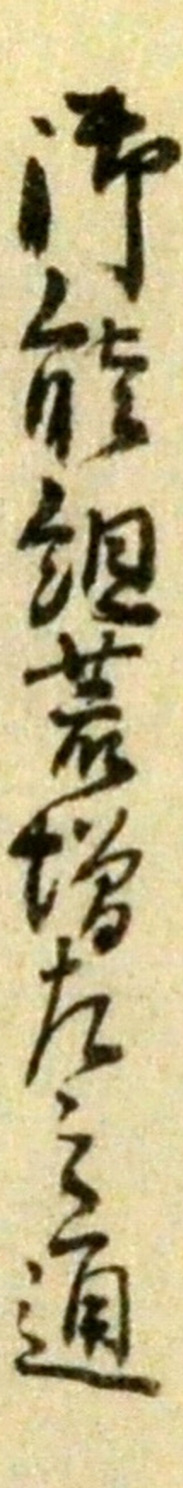御能組荒増左之通
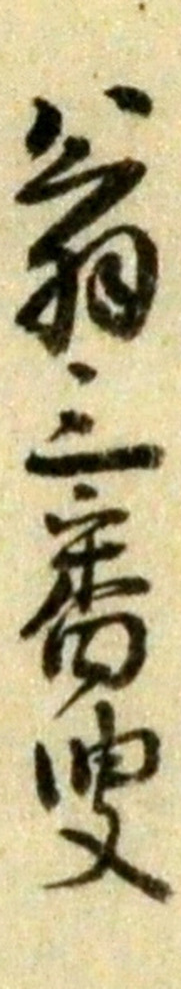翁三番叟
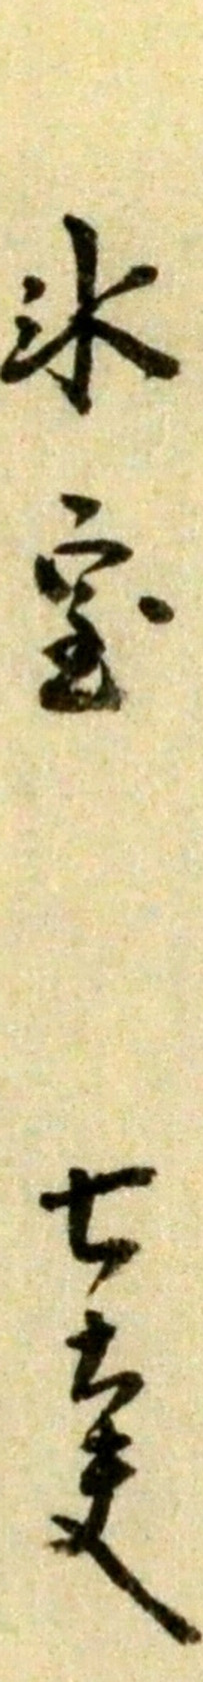氷室七大夫
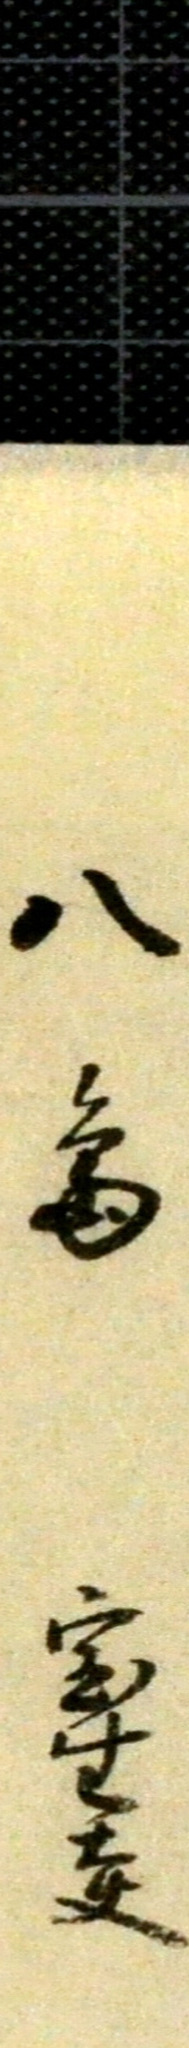八島宝生大夫
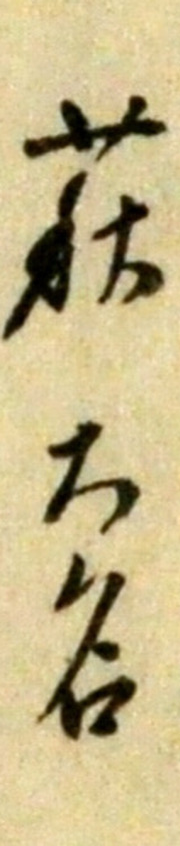萩大名
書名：若君様（家斉嫡男）誕生諸祝儀ノ節ノ留書外
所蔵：伊那市立高遠町図書館・合同会社AMANE
